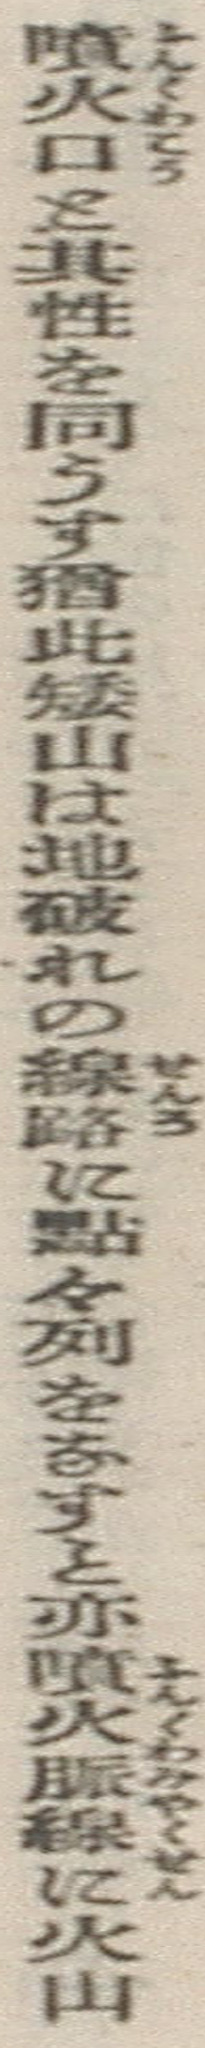噴火口と其性を同うす猶此矮山は地破れの線路に点々列をなすこと亦噴火脈線に火山
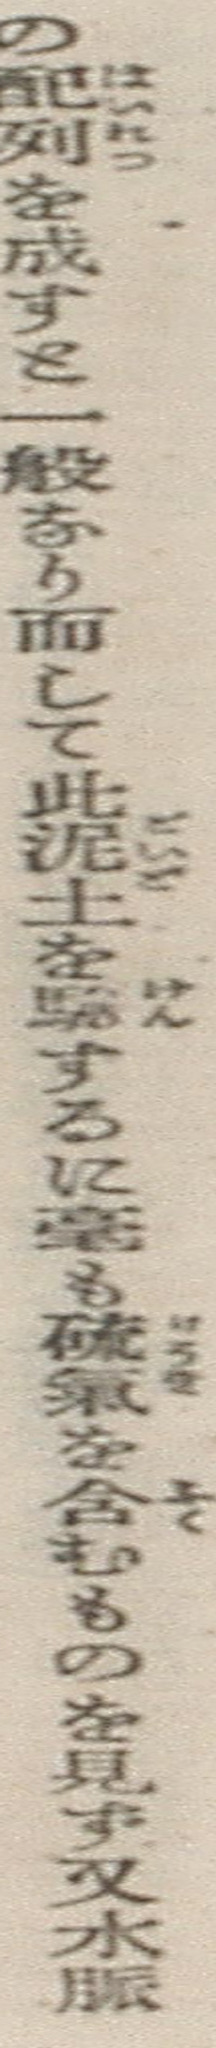の配列を成すと一般なり而して此泥土を験するに毫も硫気を含むものを見ず又水脈
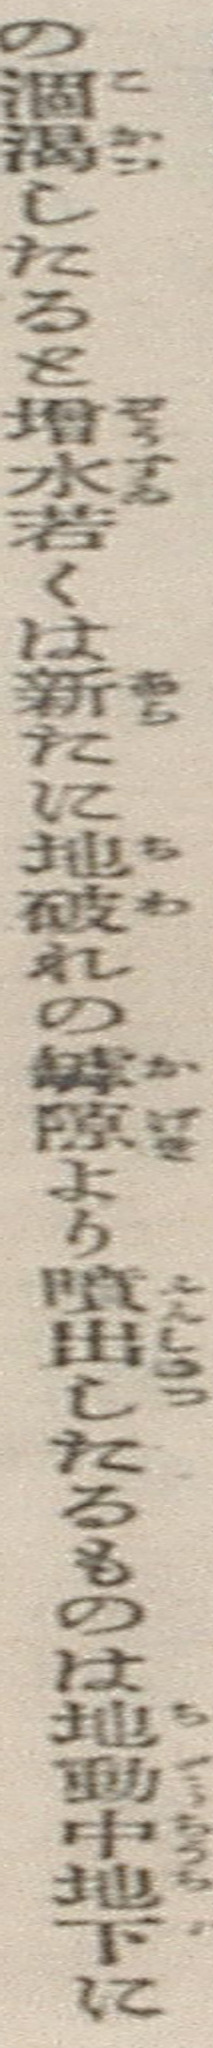の涸渇したると増水若くは新たに地破れの罅隙より噴出したるものは地動中地下に
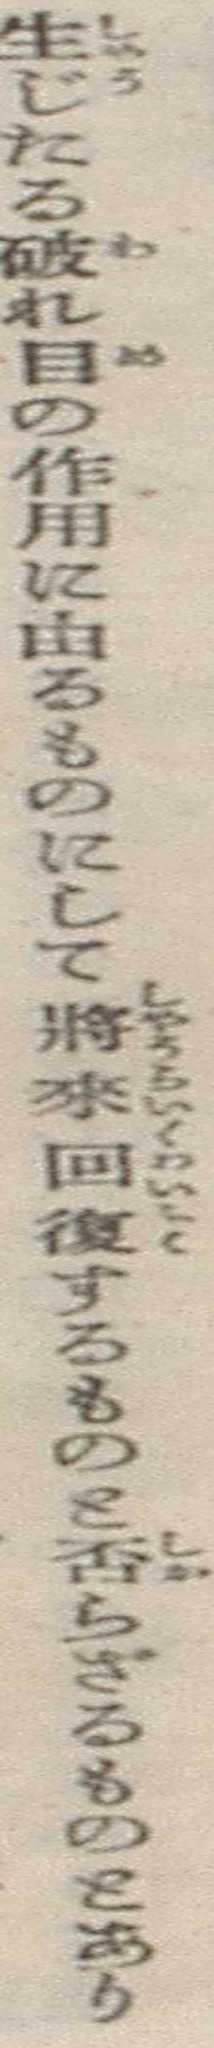生じたる破れ目の作用に由るものにして将来回復するものと否らざるものとあり
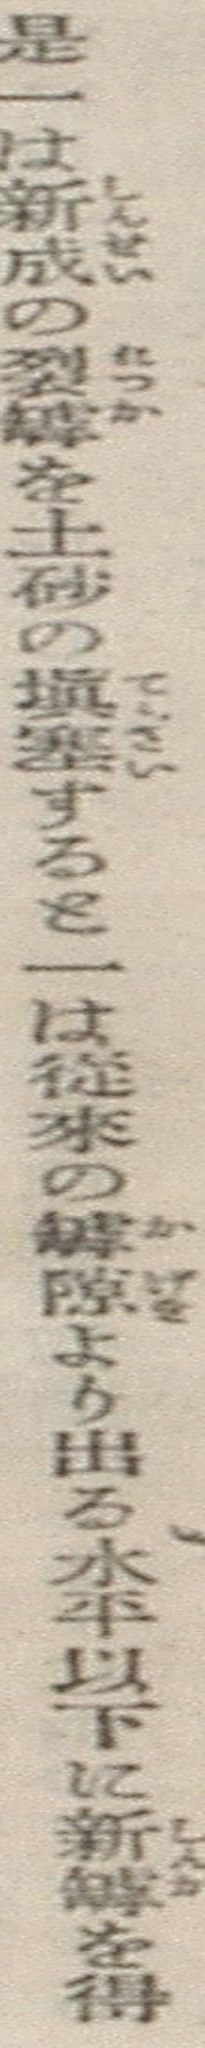是一は新成の裂罅を土砂の填塞すると一は従来の罅隙より出る水平以下に新罅を得
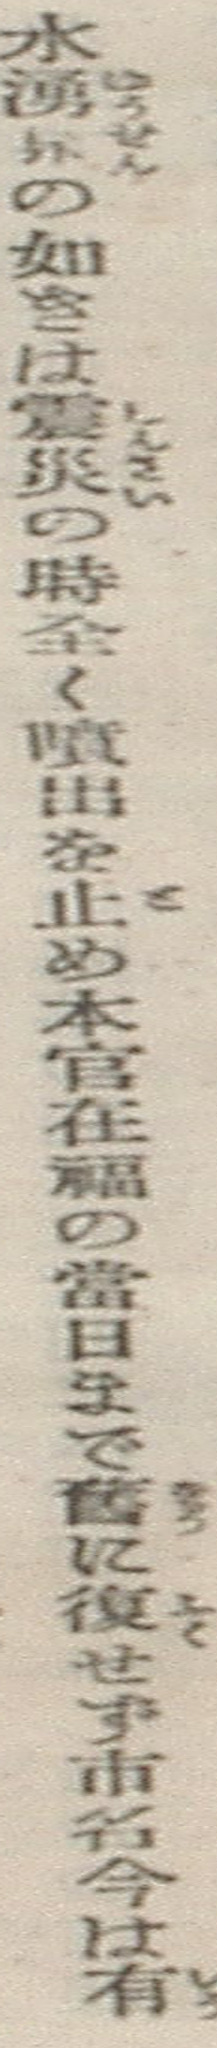水湧泉の如きは震災の時全く噴出を止め本官在福の当日まで旧に復せず市名今は有
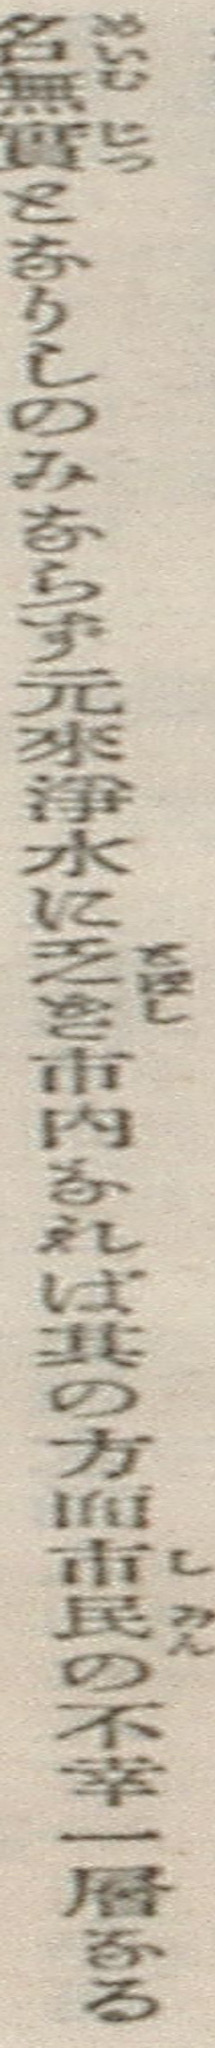名無実となりしのみならず元来浄水に乏き市内なれば其方面市民の不幸一層なる
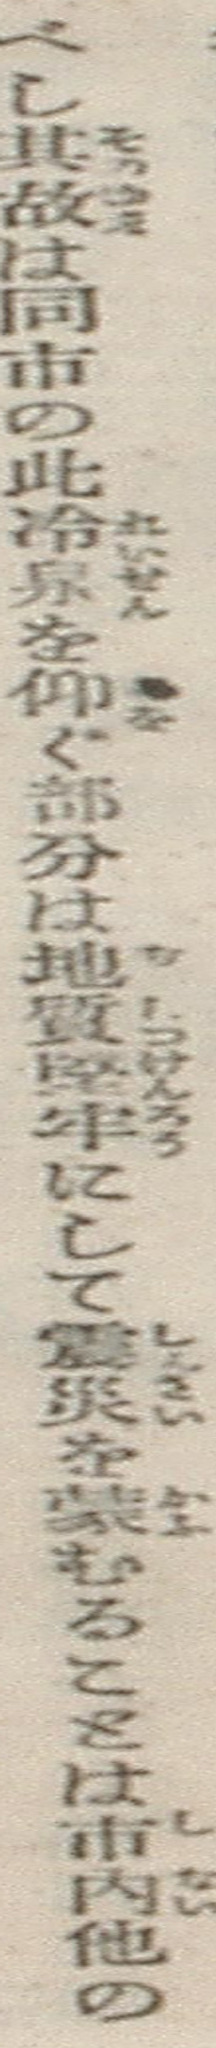べし其故は同市の此冷泉を仰ぐ部分は地質堅牢にして震災を蒙むることは市内他の
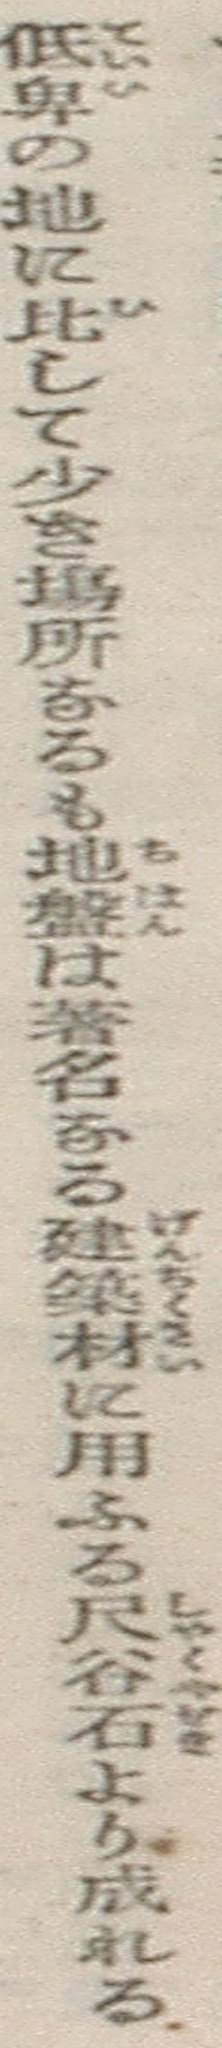低卑の地に比して少き場所なるも地盤は著名なる建築材に用ふる尺谷石より成れる
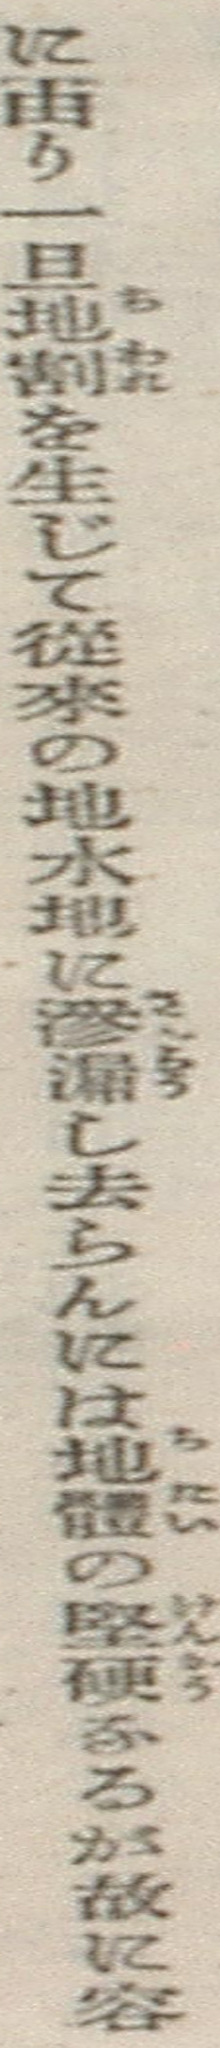に由り一旦地割を生じて従来の地水地に滲漏し去らんには地体の堅硬なるが故に容
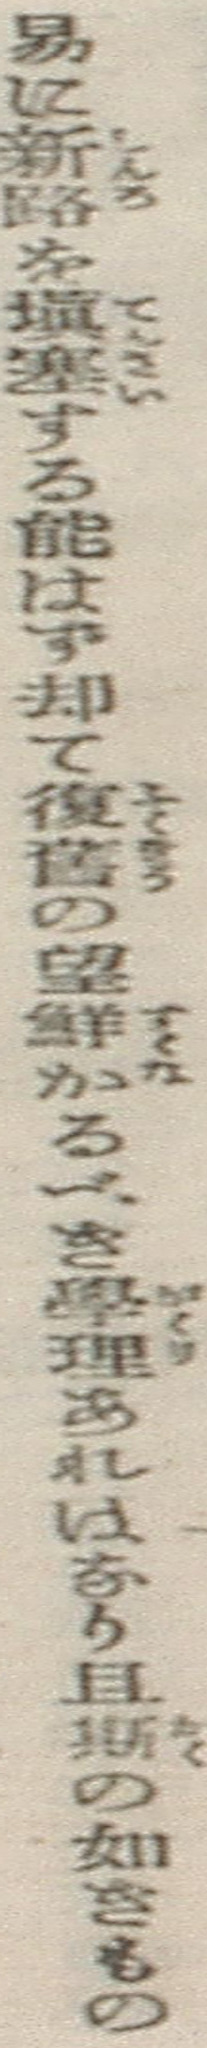易に新路を填塞する能はず却て復旧の望鮮かるべき学理あれはなり且斯の如きもの
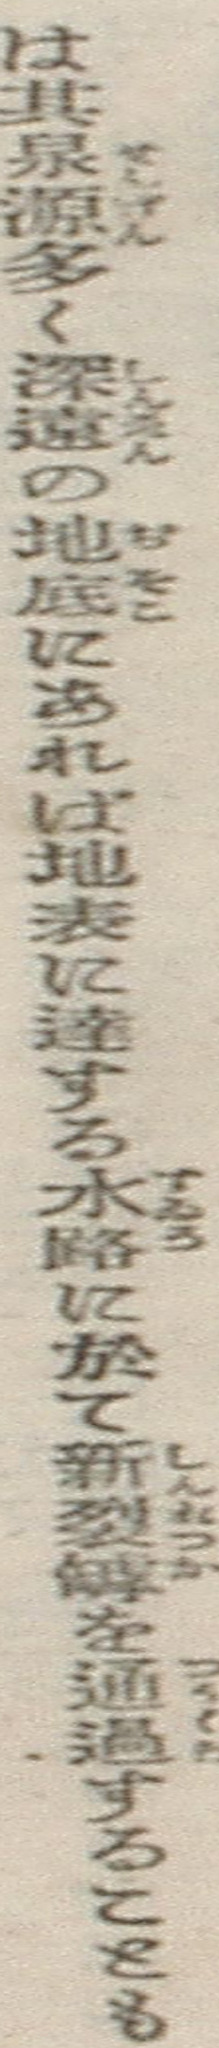は其泉源多く深遠の地底にあれば地表に達する水路に於て新裂罅を通過することも
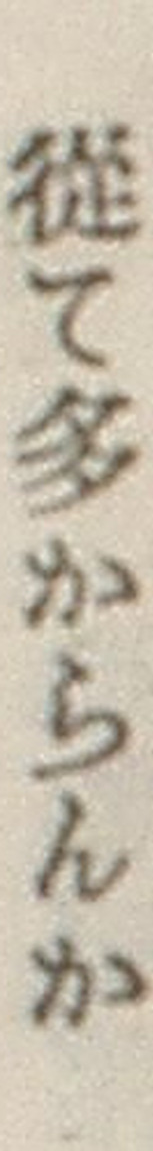従て多からんか

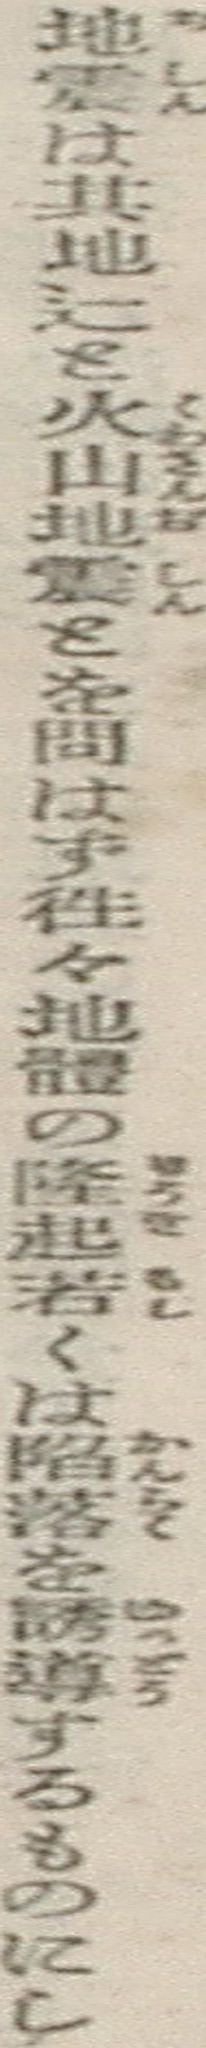地震は其地辷と火山地震とを問わず往々地体の隆起若くは陥落を誘導するものにし
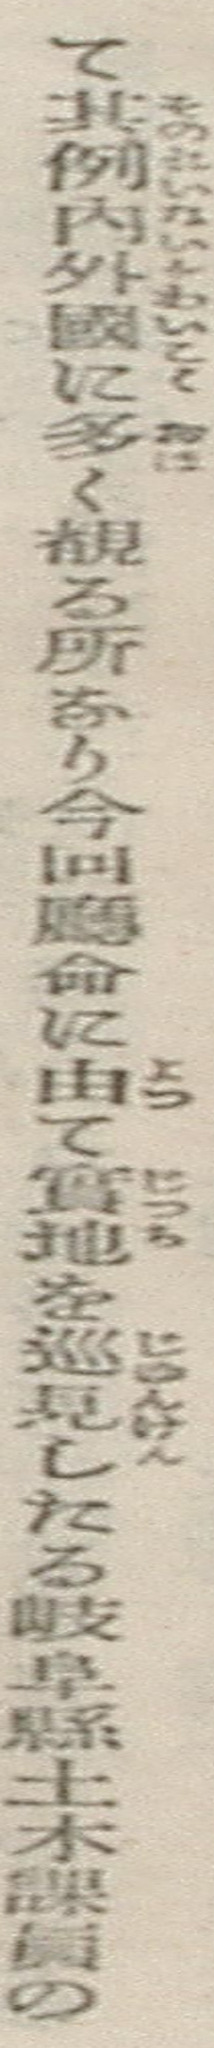て其例内外国に多く覩る所なり今回庁命に由て実地を巡見したる岐阜県土木課員の
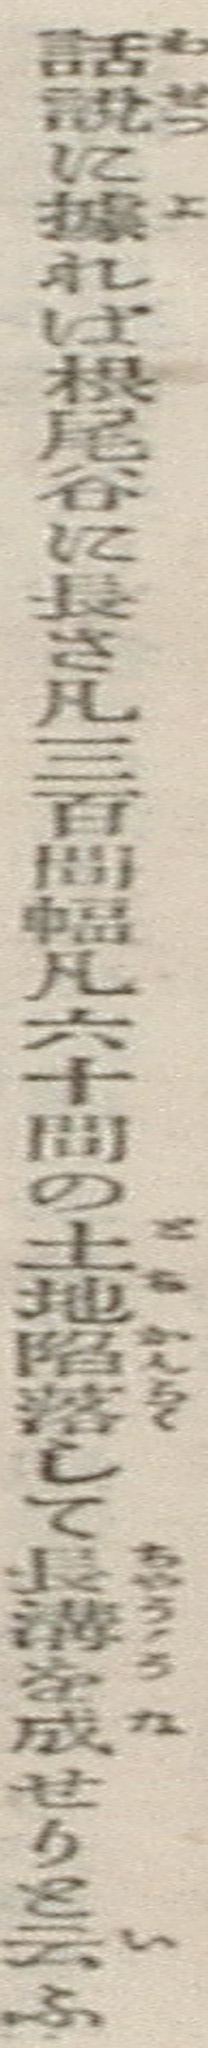話説に據れば根尾谷に長さ凡三百間幅凡六十間の土地陥落して長溝を成せりと云ふ
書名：愛知岐阜福井三県　大地震見聞録（内題）
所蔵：東京大学地震研究所図書室 Earthquake Research Institute Library, The University of Tokyo, JAPAN
